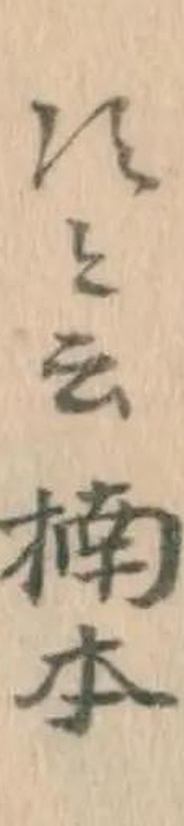すと云楠本
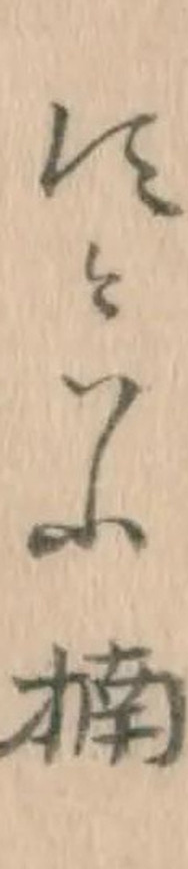すといふ楠
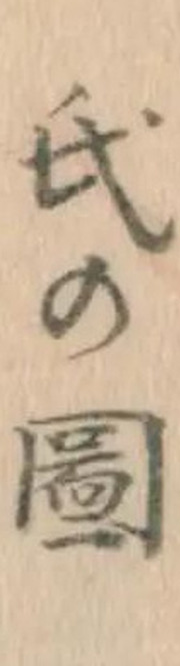氏の図
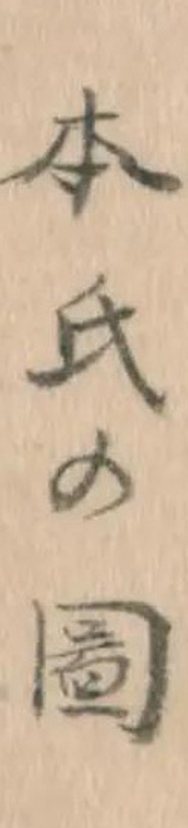本氏の図

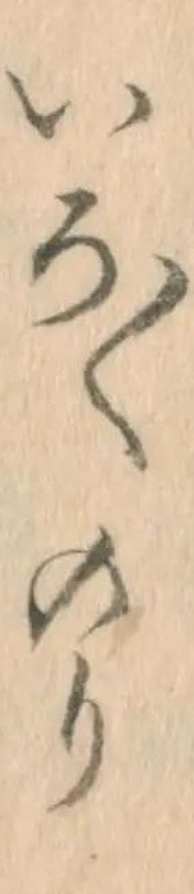いろ〳〵のり
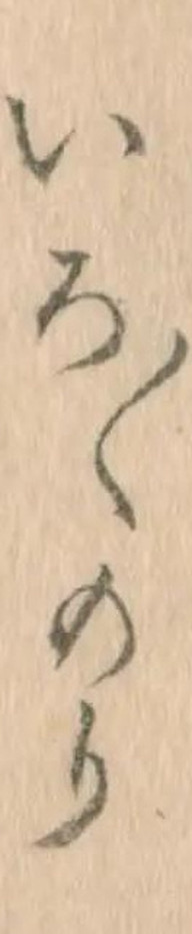いろ〳〵のり
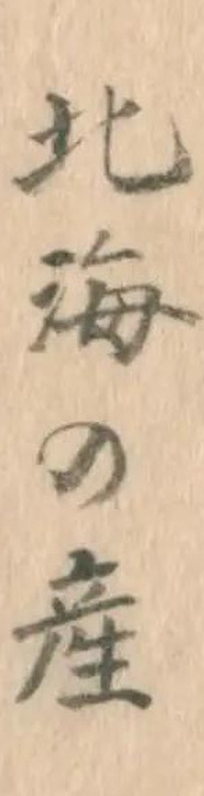北海の産
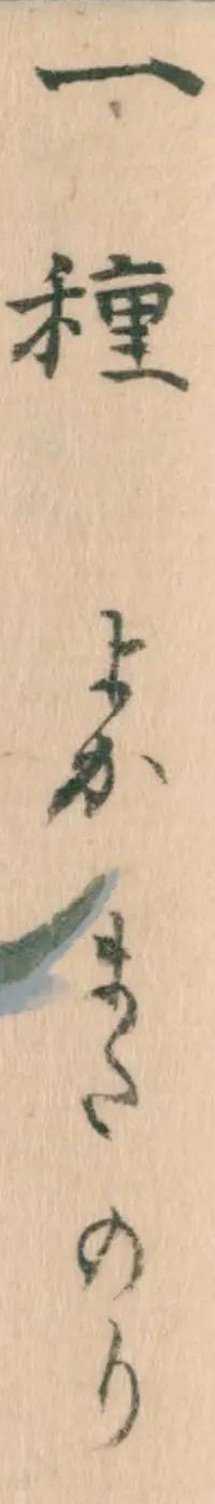一種よかまたのり
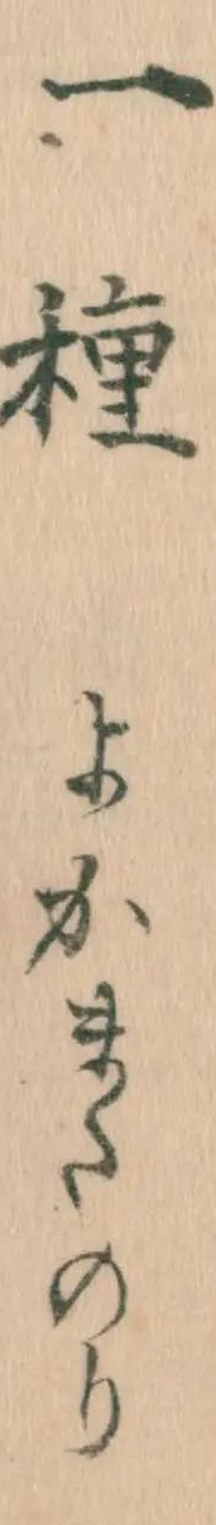一種よかまたのり
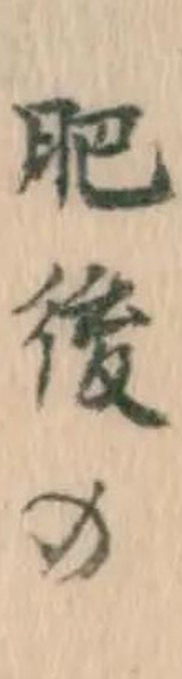肥後の
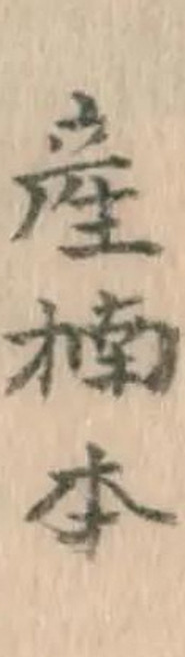産楠本
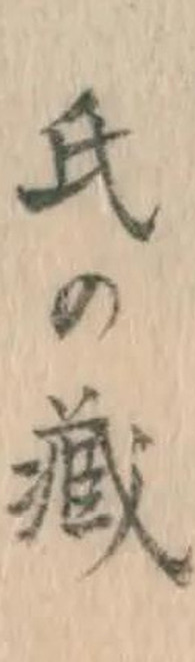氏の蔵

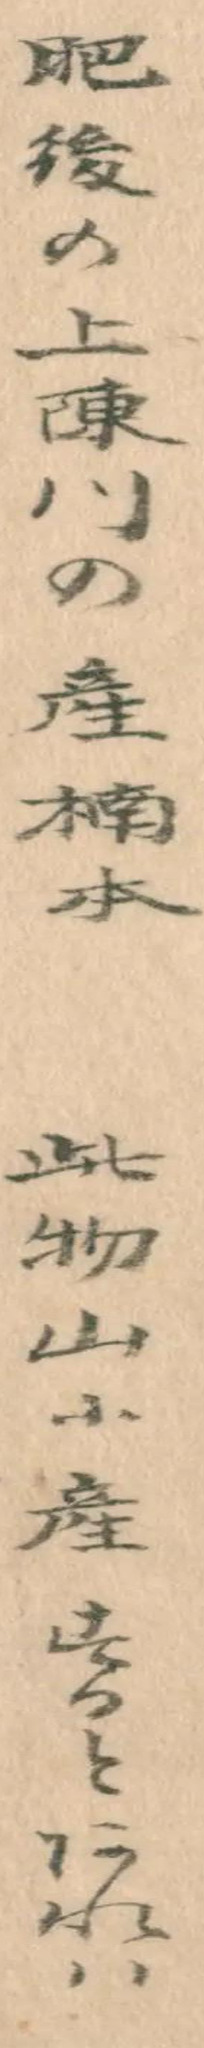一種肥後の上陳川の産楠本此物山に産するとあれは
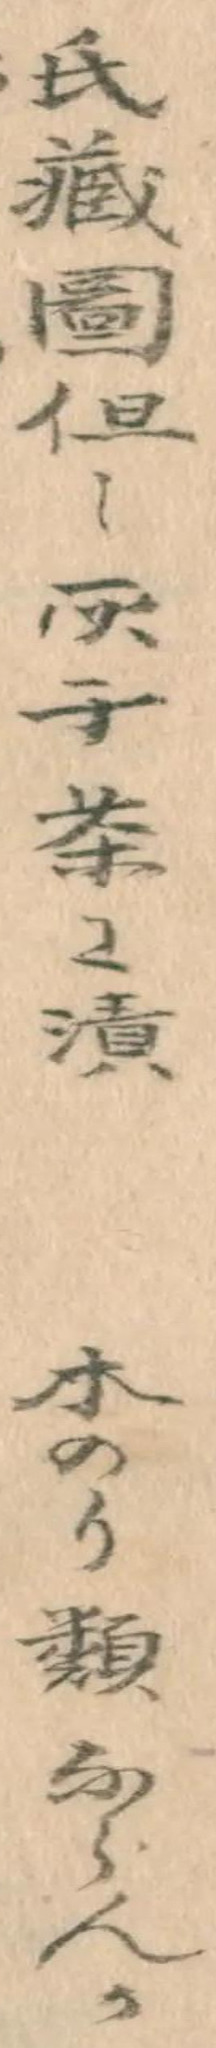氏蔵図但し灰于茶に漬木のり類ならんか
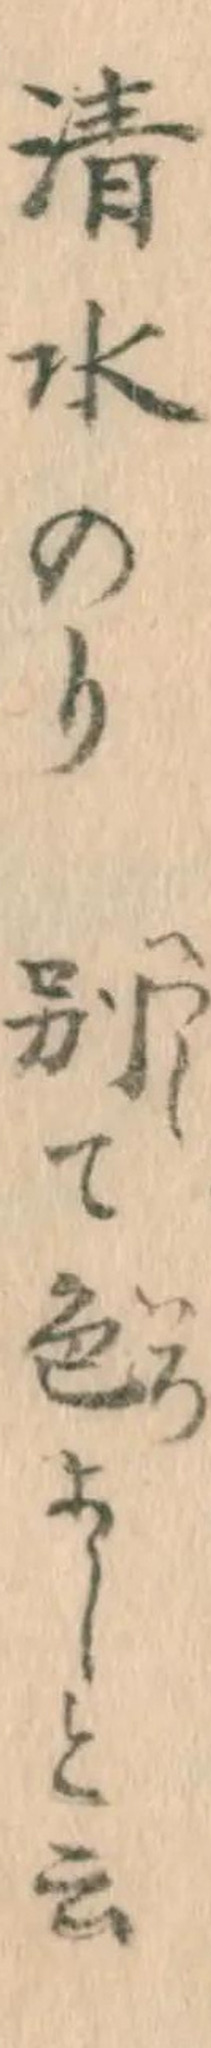清水のり別て色よしと云
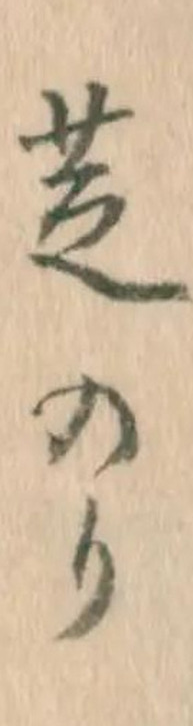芝のり
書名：本草図譜. 巻52-54
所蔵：国立国会図書館 National Diet Library, JAPAN
